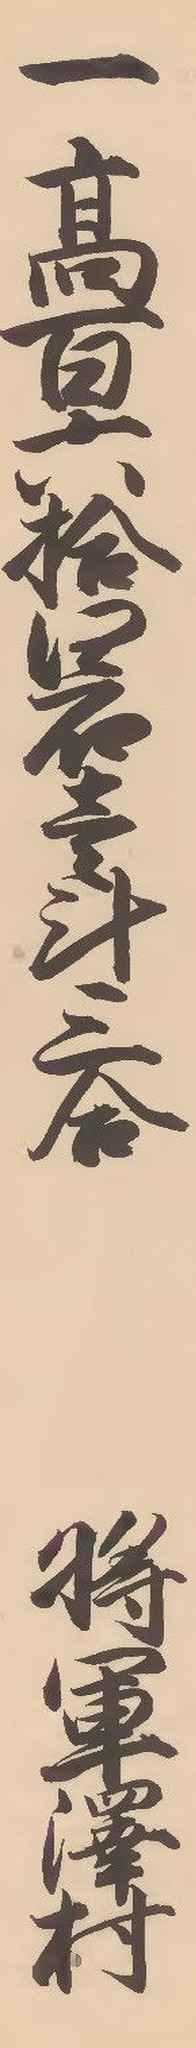一高百六拾四石壱斗三合将軍澤村
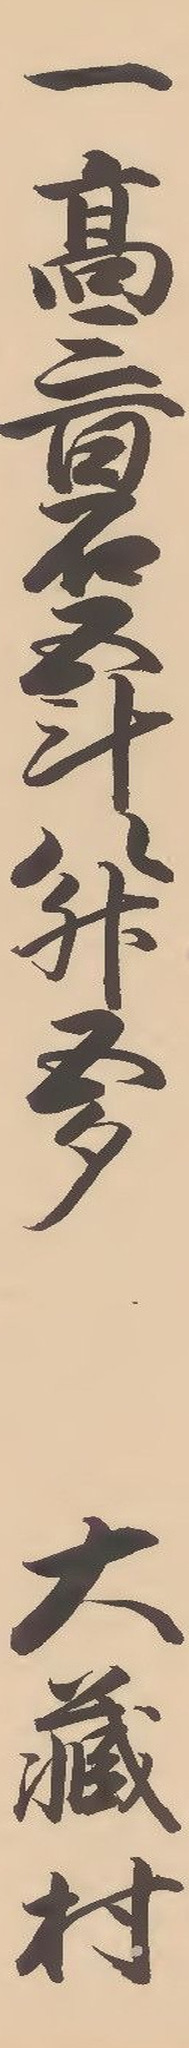一高三百石五斗八升五勺大蔵村
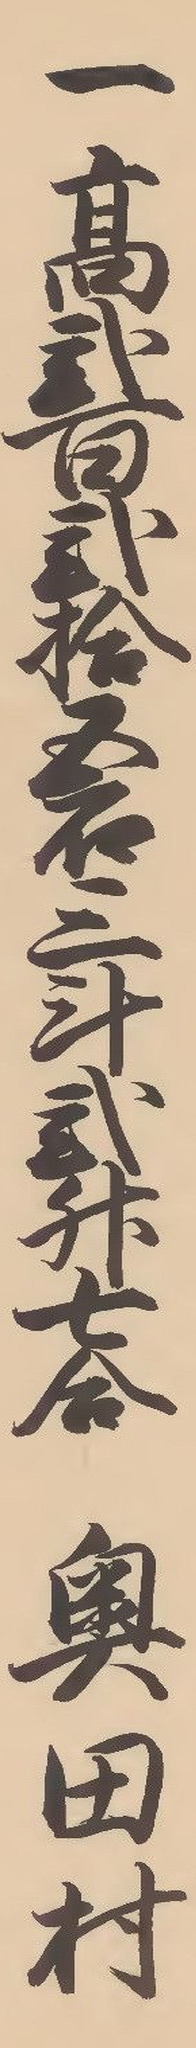一高弐百弐拾五石三斗弐升七合奥田村
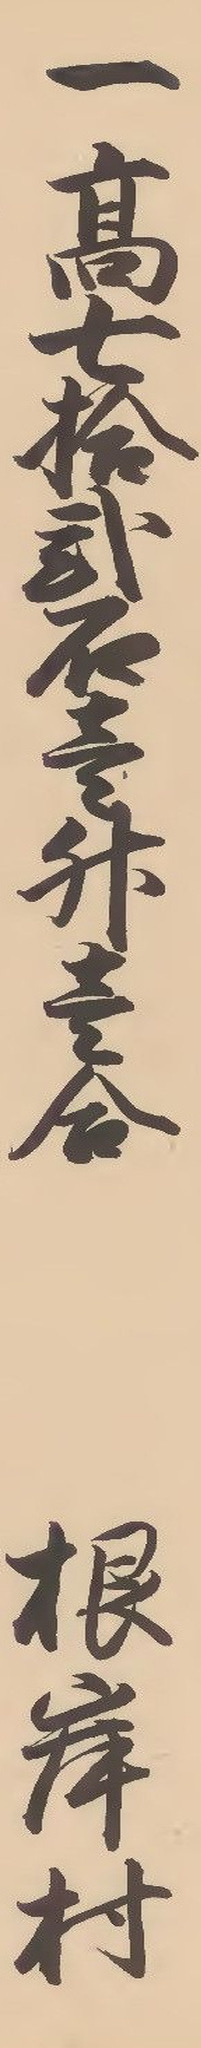一高七拾弐石壱升壱合根岸村
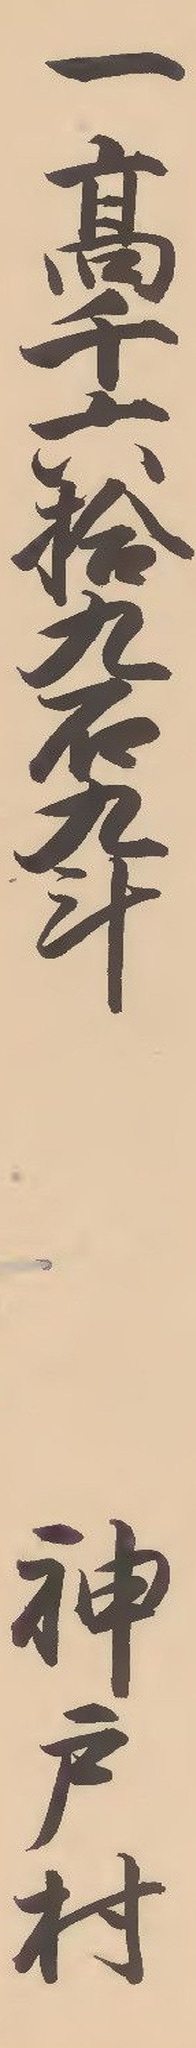一高千六拾九石九斗神戸村

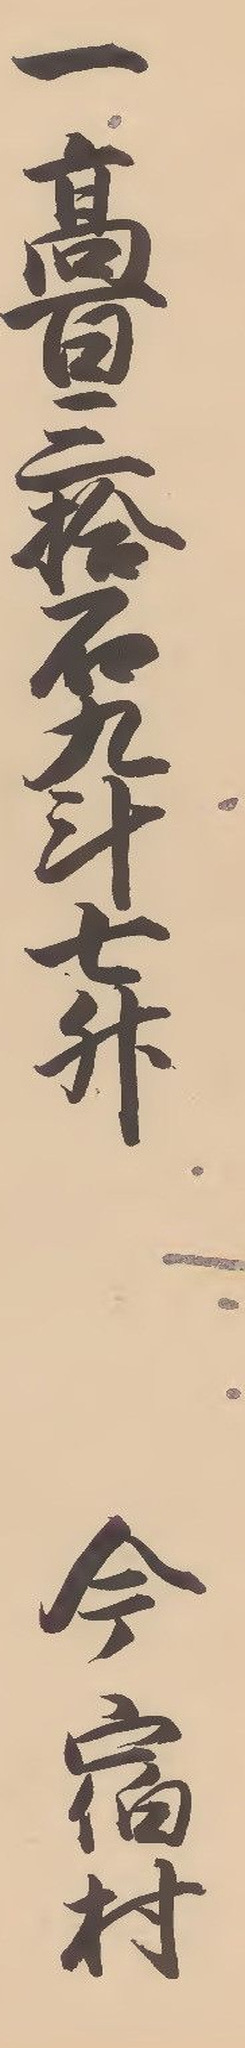一高百三拾石九斗七升今宿村
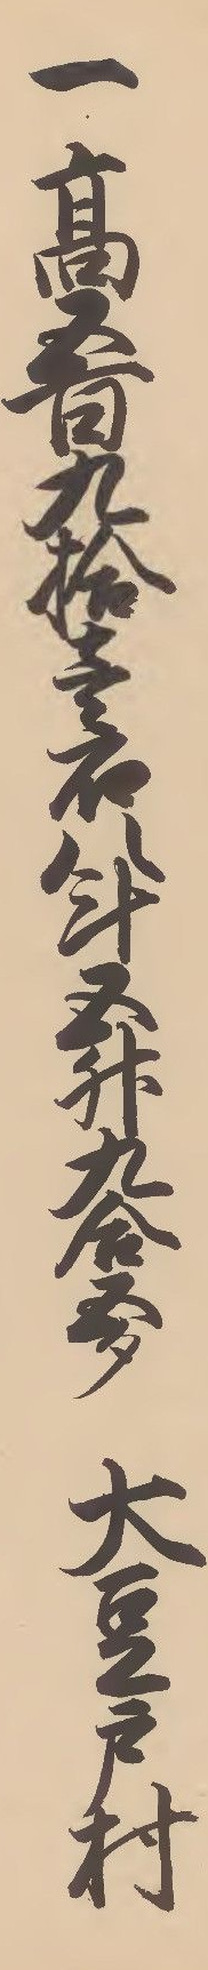一高五百九拾壱石八斗五升九合五勺大豆戸村
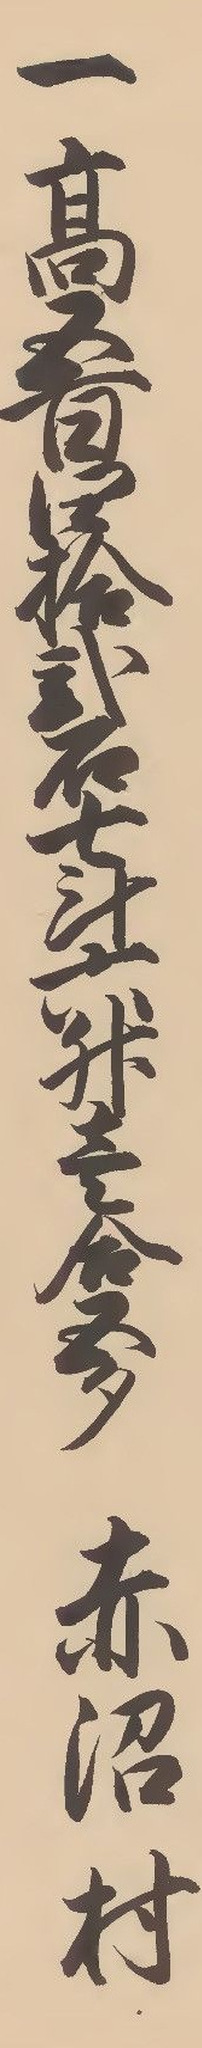一高百四拾弐石七斗六升壱合五勺赤沼村
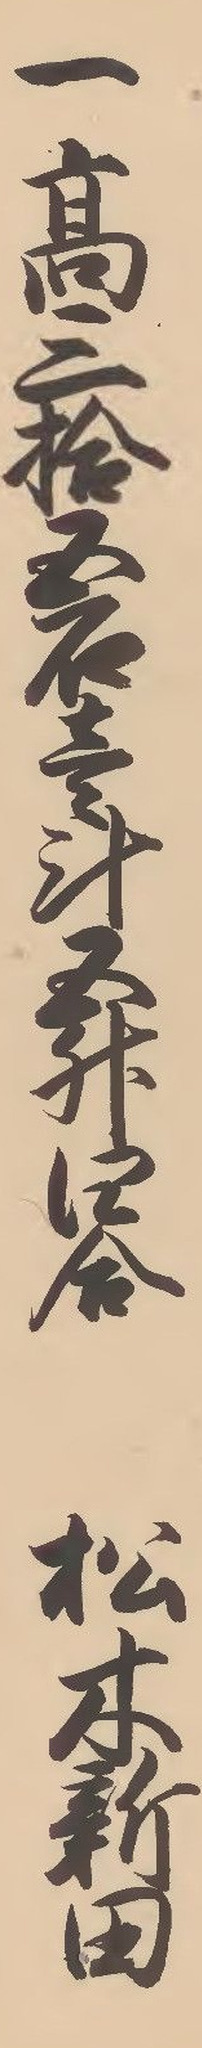一高三拾五石壱斗五升四合松木新田
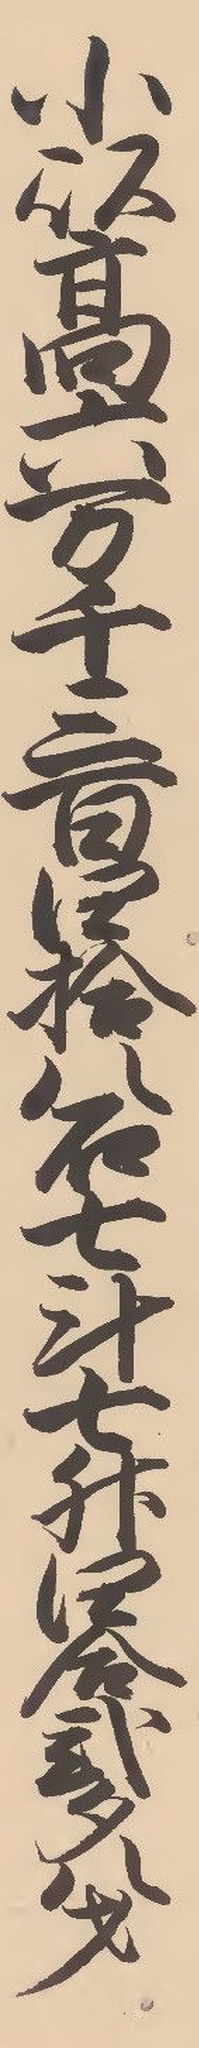小以高六万千三百四拾八石七斗七升四合弐勺八才

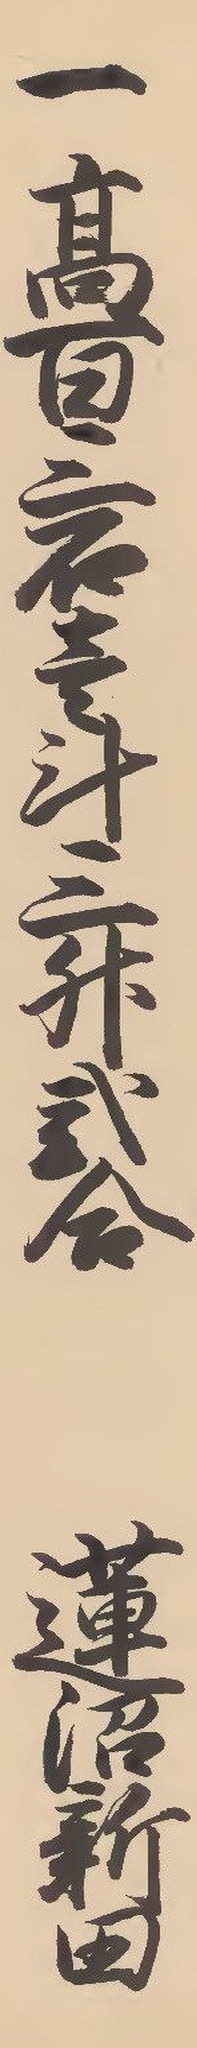一高百三石壱斗三升弐合蓮沼新田
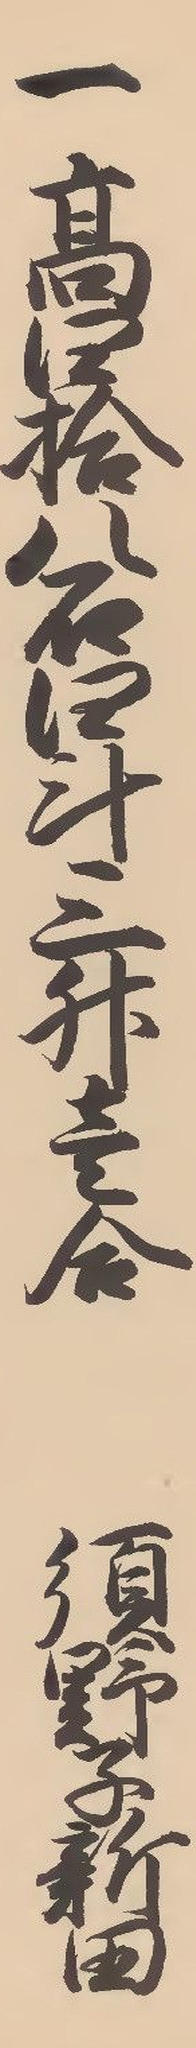一高四拾八石四斗三升壱合須野子新田
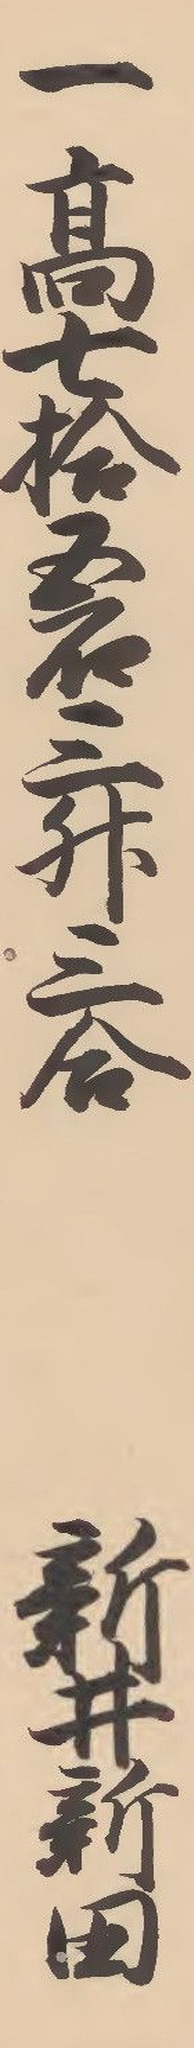一高七拾五石三升三合新井新田
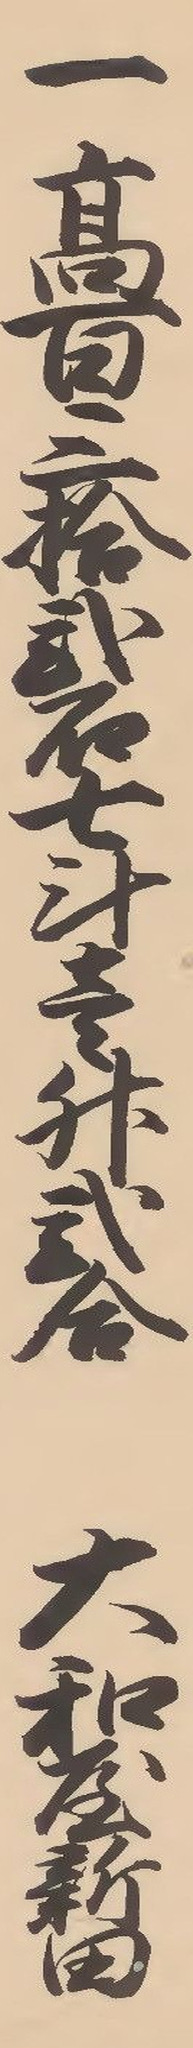一高百三拾弐石七斗壱升弐合大和屋新田
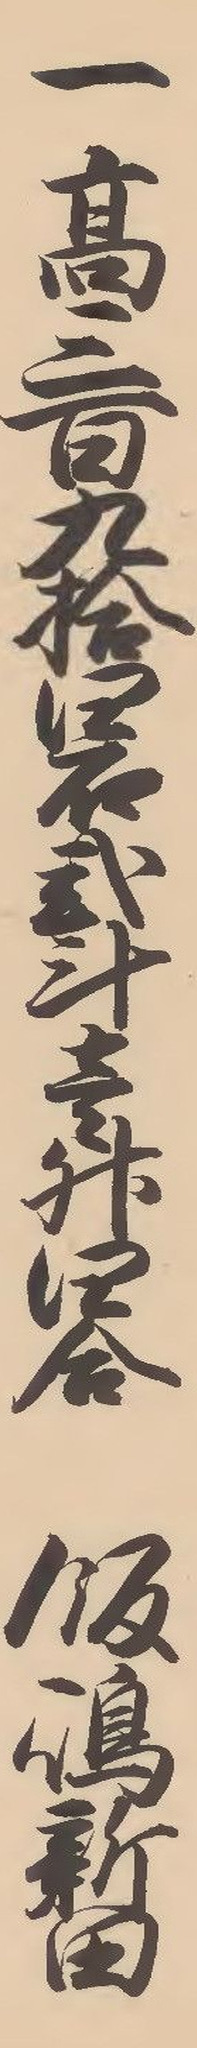一高三百九拾四石弐斗壱升四合飯嶋新田
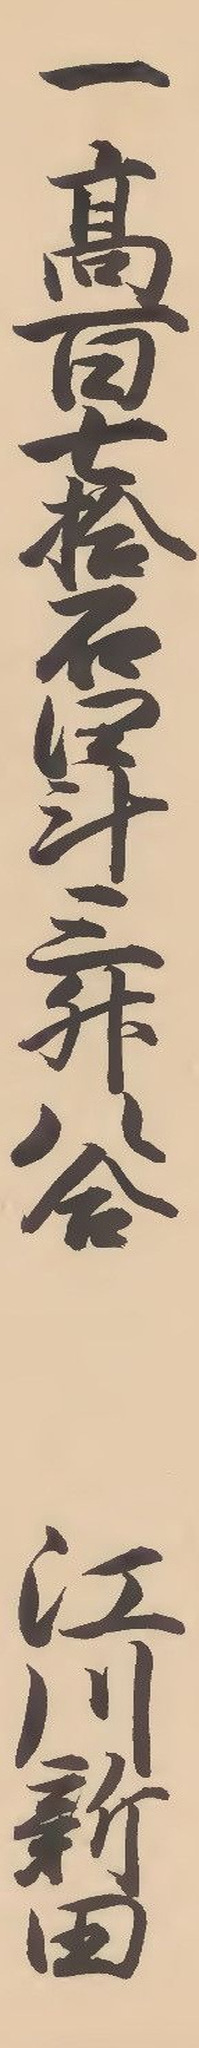一高百七拾石四斗三升八合江川新田
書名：武蔵国郷帳　下
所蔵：国立公文書館 National Archives of Japan
